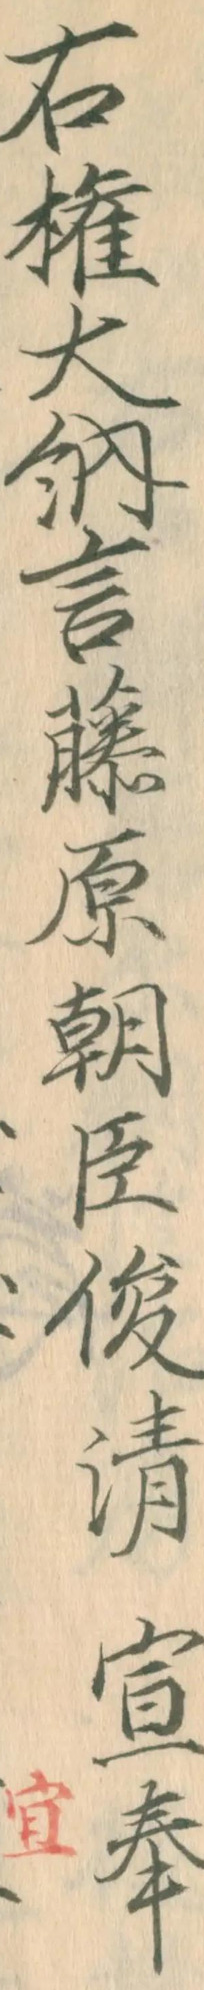右権大納言藤原朝臣俊清宣奉
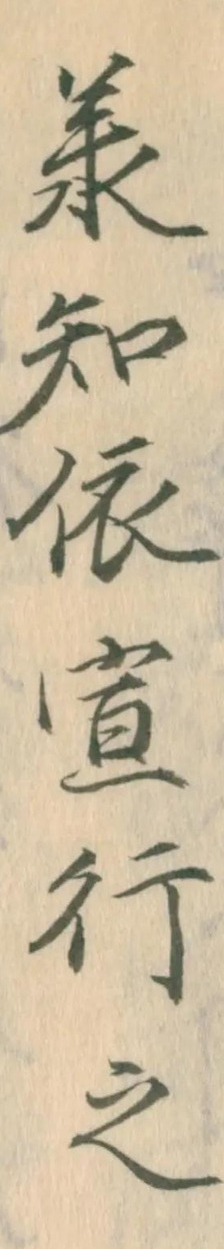承知依宣行之
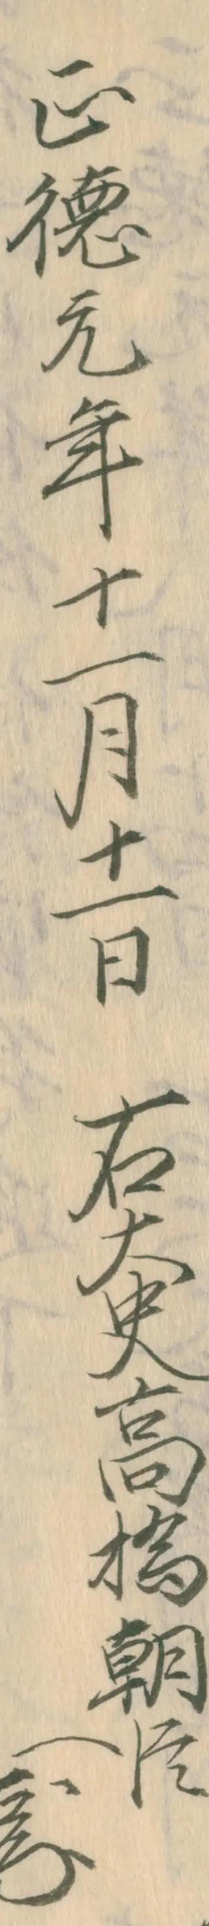正徳元年十一月十一日右大史高橋朝臣奉
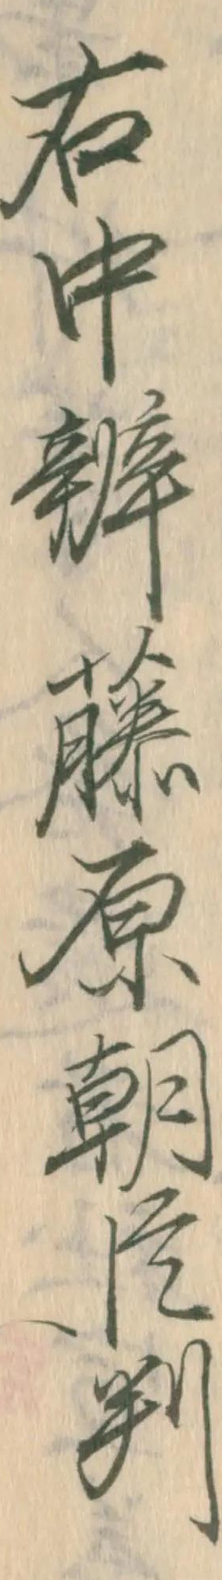右中弁藤原朝臣判
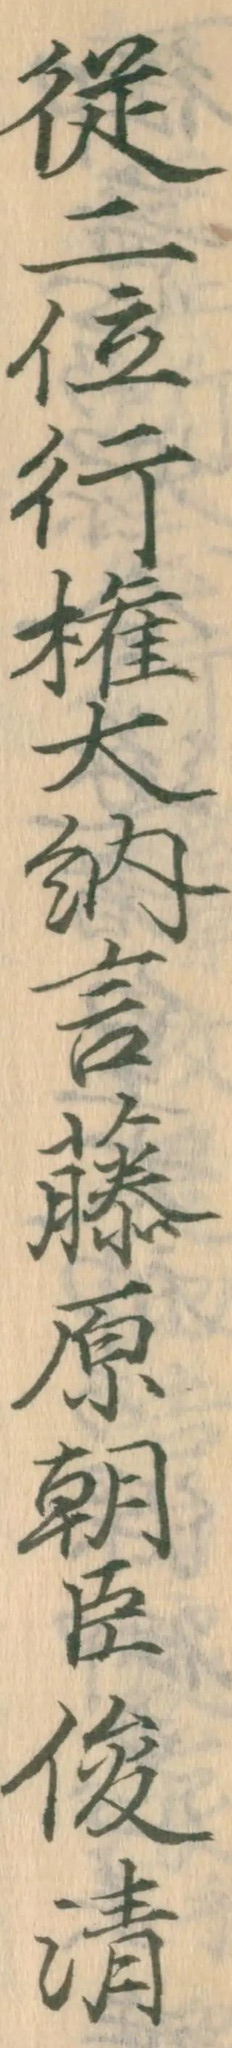従二位行権大納言藤原朝臣俊清
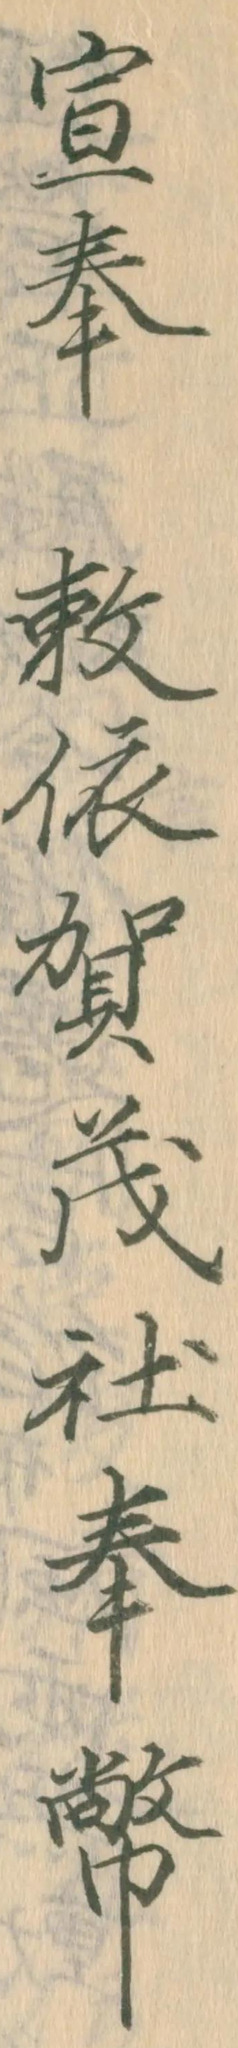宣奉敕依賀茂社奉幣
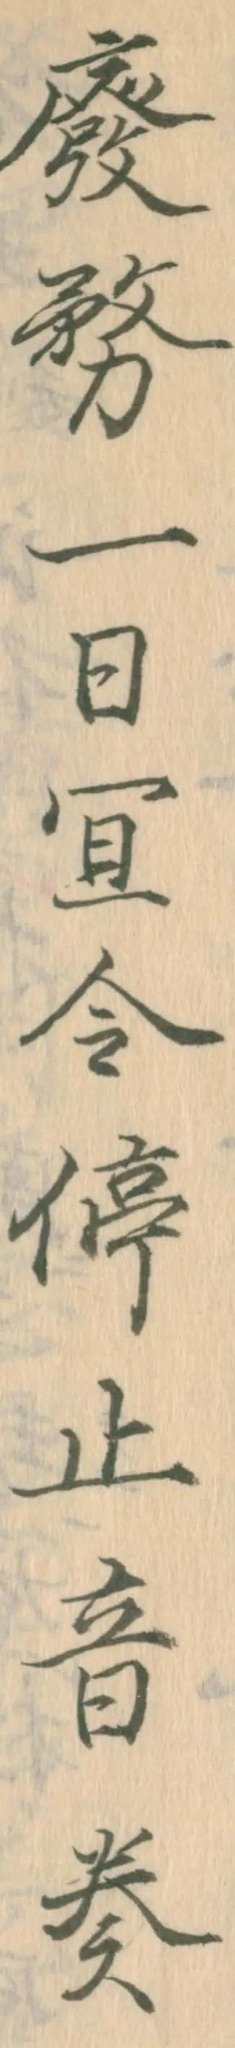廃務一日冝令停止音奏
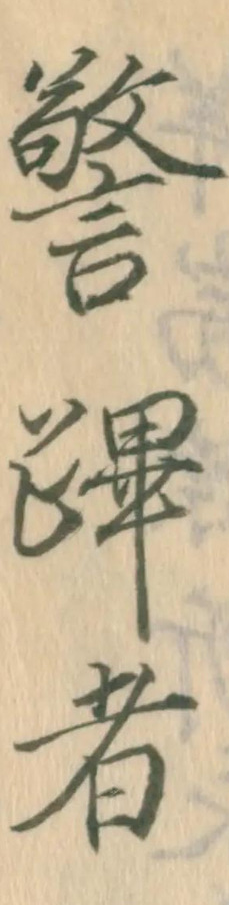警蹕者
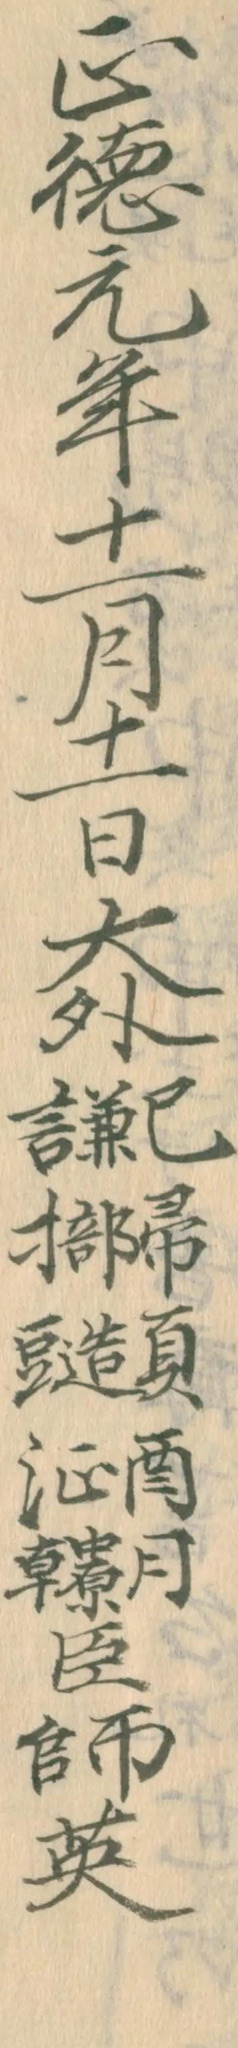正徳元年十一月十一日大外臣師英奉

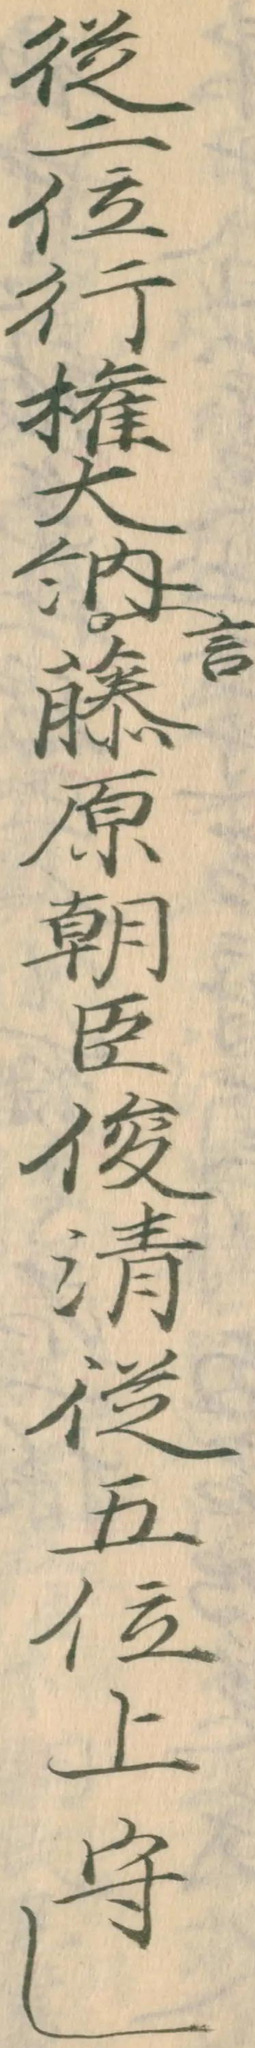従二位行権大納￮藤原朝臣俊清従五位上守」

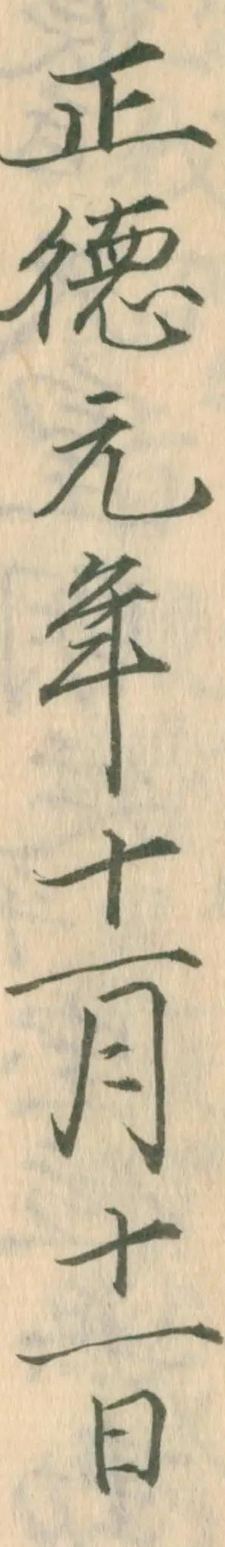正徳元年十一月十一日
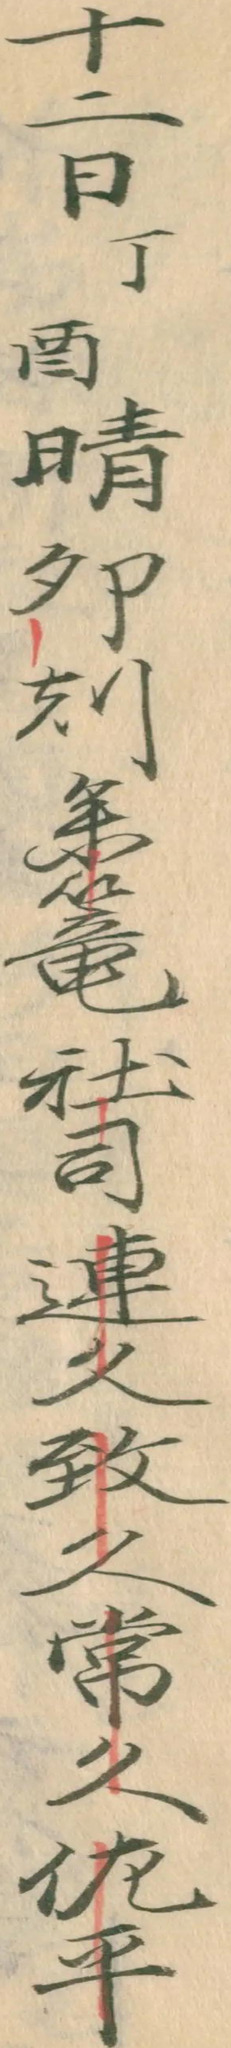十二日丁酉晴卯_刻参-篭社-司連久致久常久佐平
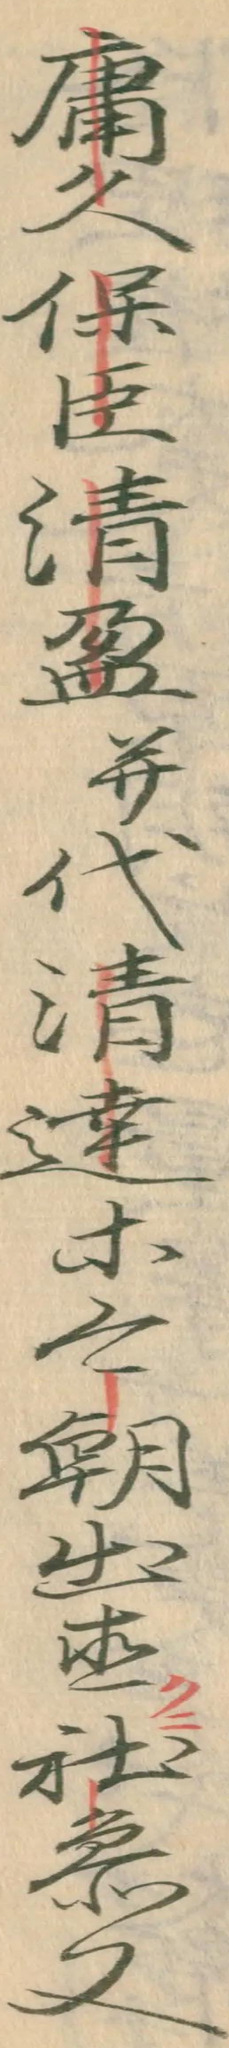庸久保臣清盈并代清達等今-朝出直社-参又
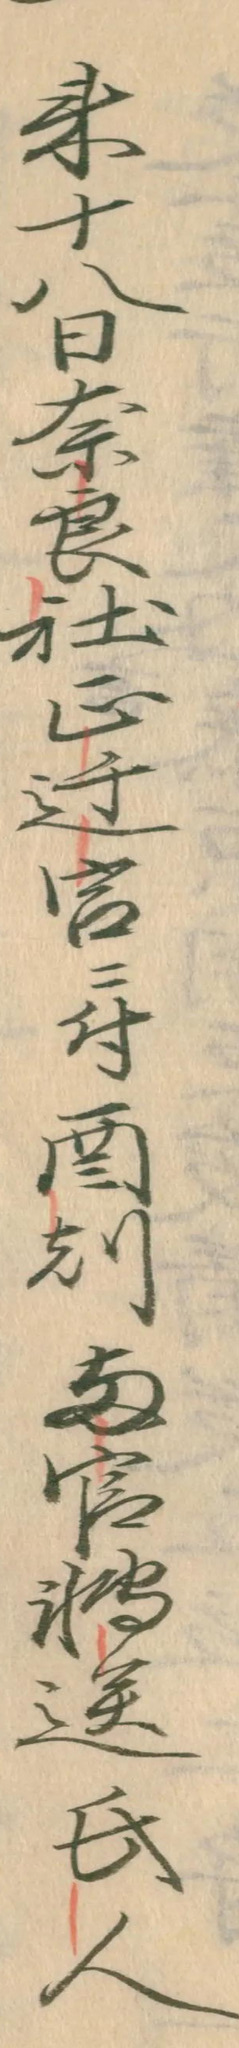一来十八日奈-良_社正-迁-宮ニ付酉_刻両-官転-送氏
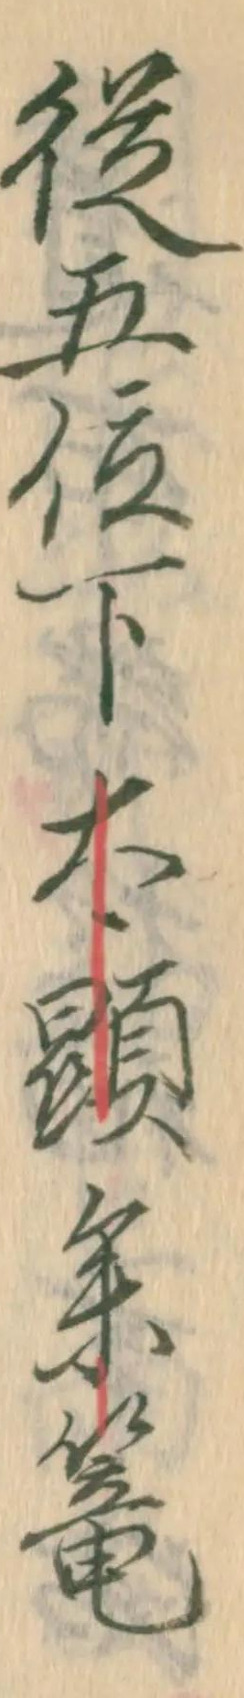従五位下太顕参-篭
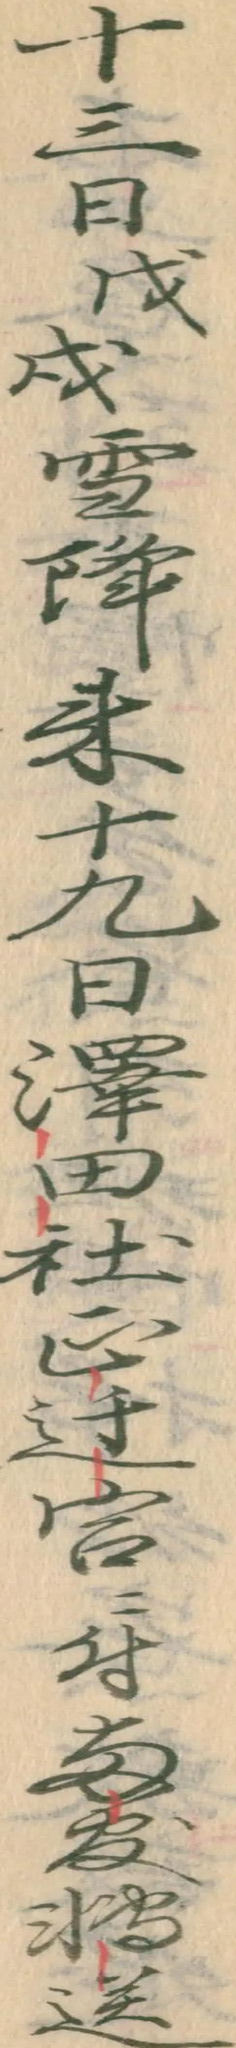十三日戊戌雪降来十九日澤_田_社正-迁-宮ニ付両-官転-送
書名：賀茂社記録. 第16冊
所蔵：国立国会図書館 National Diet Library, JAPAN
